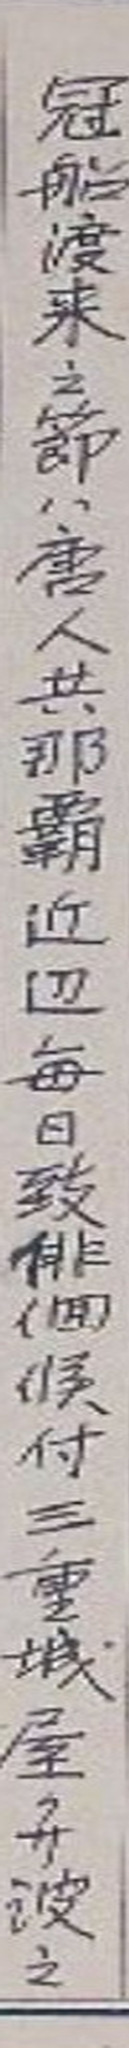冠船渡来之節は唐人共那覇近辺毎日致徘徊候付三重城屋并波之
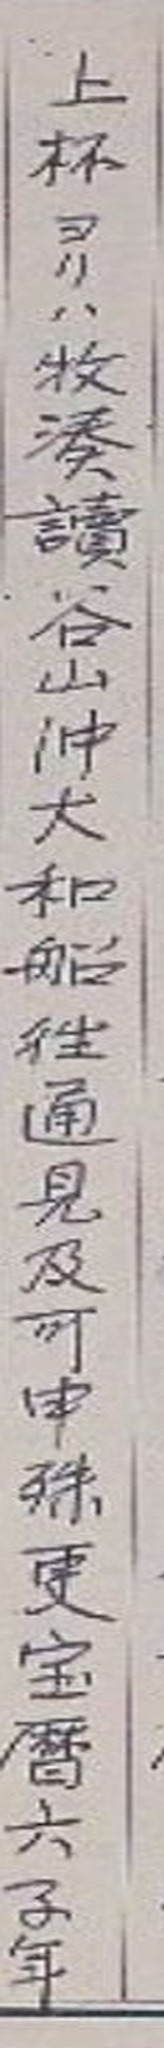上抔よりは牧湊読谷山沖大和船往通見及可申殊更宝暦六子年
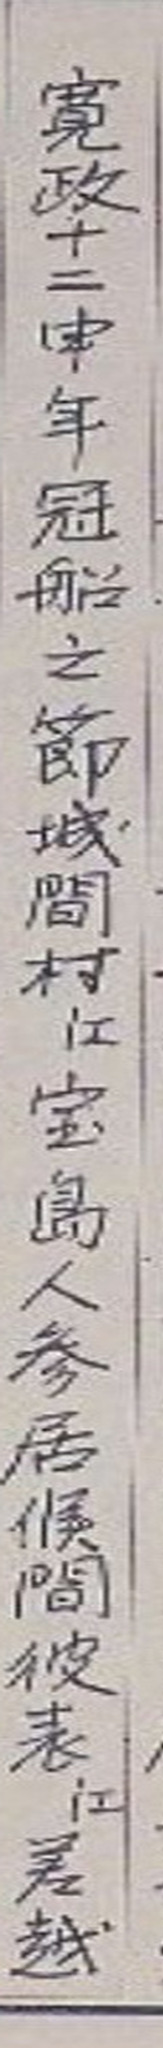寛政十二申年冠船之節城間村え宝島人参居候間彼表え差越
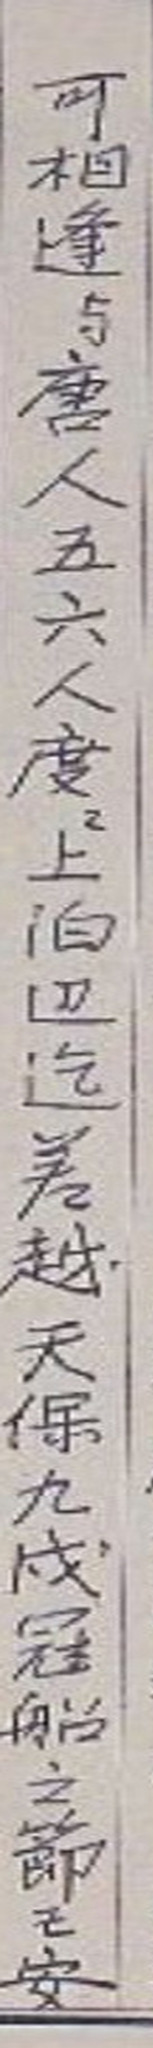可相逢と唐人五六人度々上泊辺迄差越天保九戌冠船之節も安
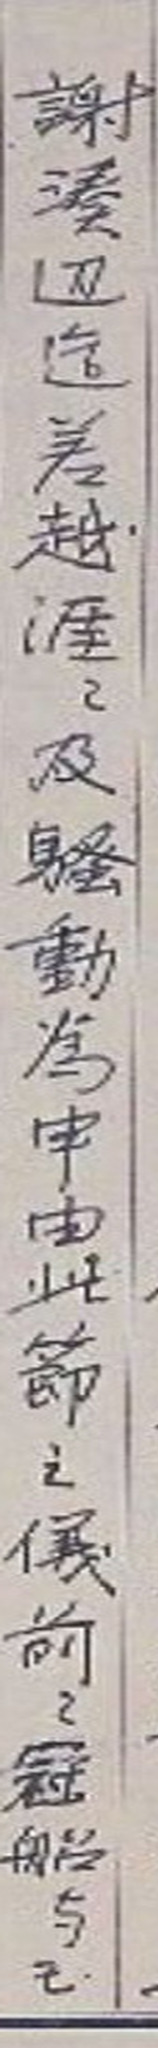謝湊辺迄差越涯々及騒動為申由此節之儀前々冠船とも
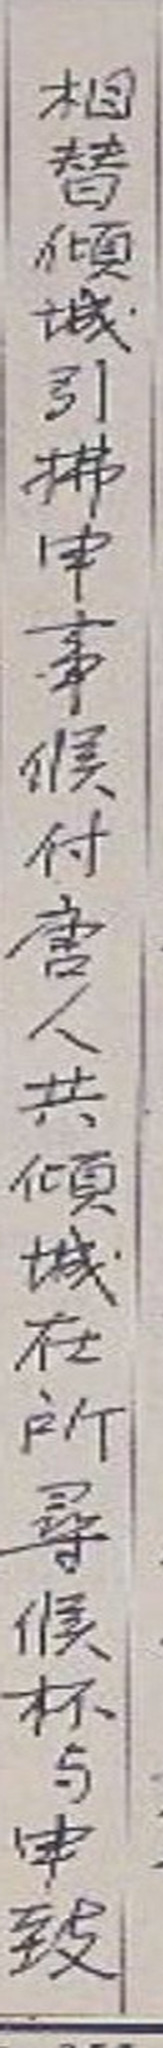相替傾城引払申事候付唐人共傾城在所尋候抔と申致
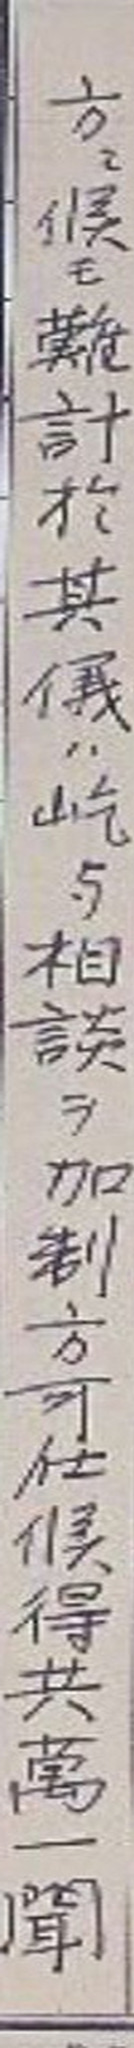方々候も難計於其儀は屹と相談を加制方可仕候得共万一聞
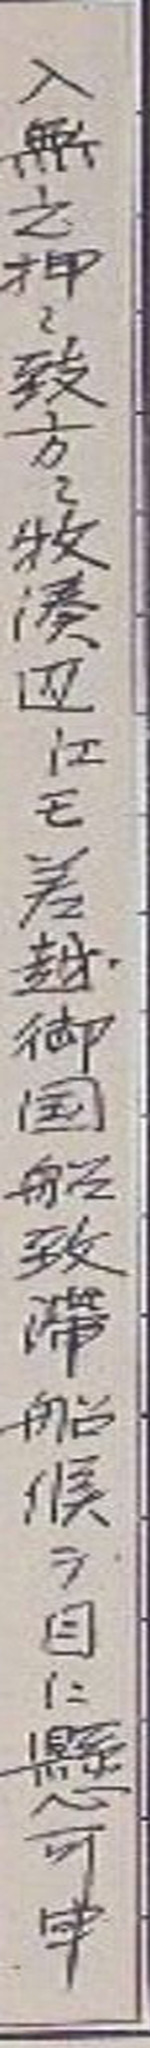入無之押々致方々牧湊辺えも差越御国船致滞船候を目に懸可申
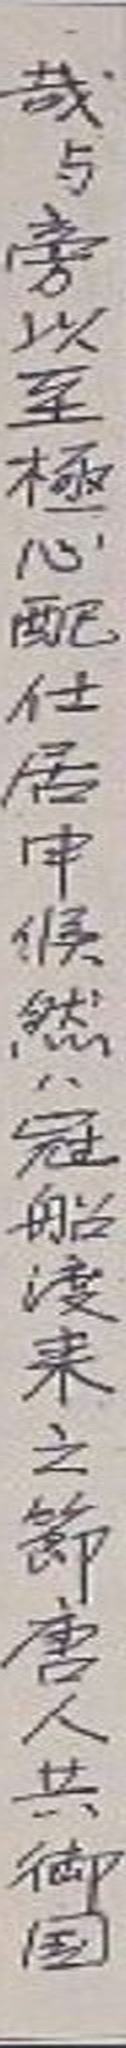哉と旁以至極心配仕居申候然は冠船渡来之節唐人共御国
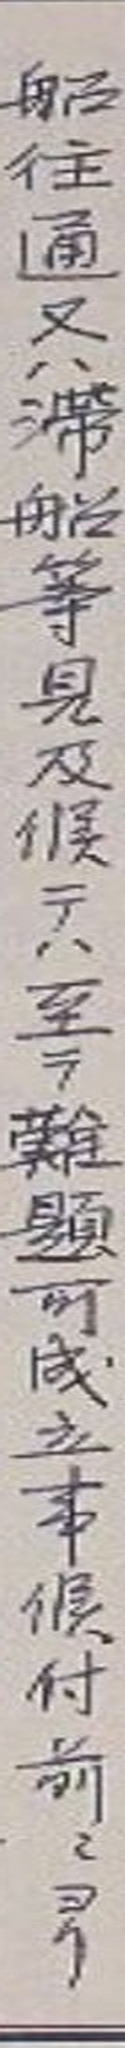船往通又は滞船等見及候ては至て難題可成立事候付前々より
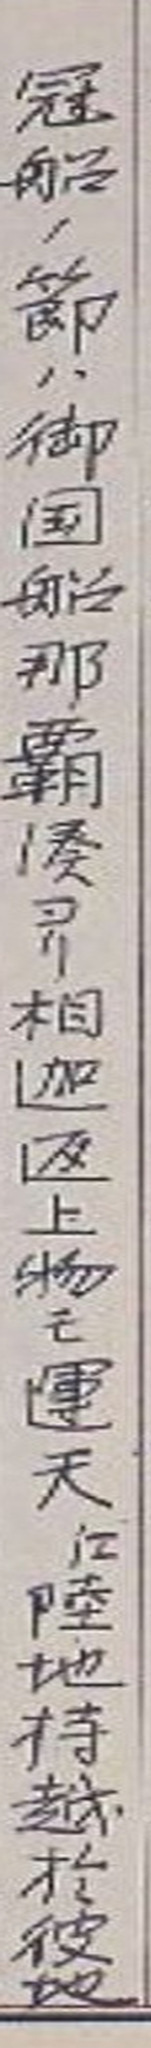冠船之節は御国船那覇湊より相迦返上物も運天え陸地持越於彼地
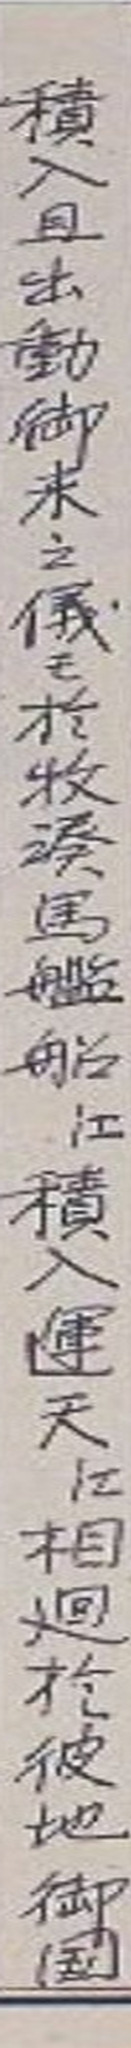積入且出動御米之儀も於牧湊馬艦船え積入運天え相廻於彼地御国
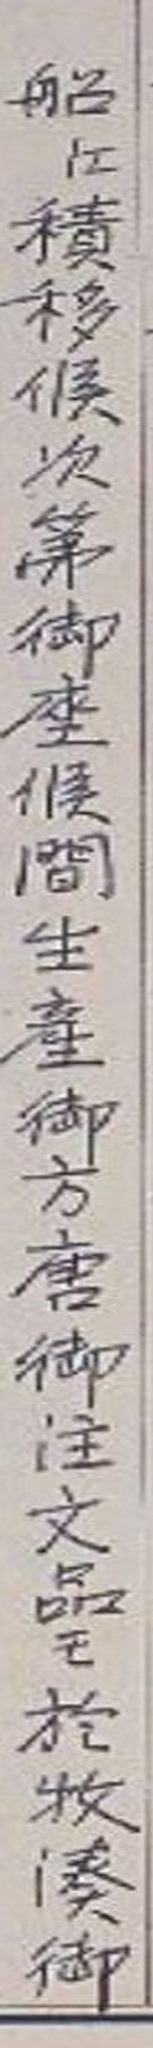船え積移候次第御座候間生産御方唐御注文品も於牧湊御
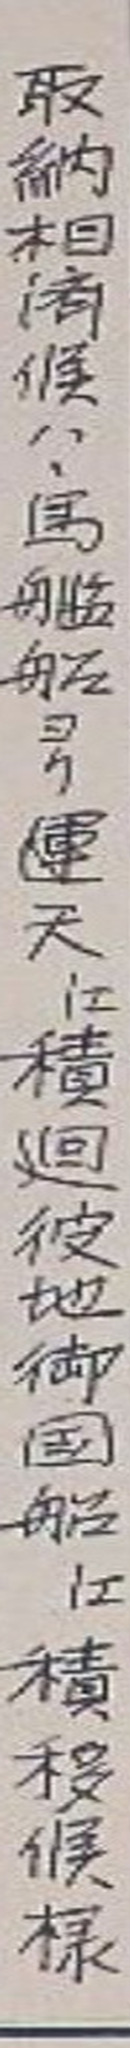取納相済候はゝ馬艦船より運天え積廻彼地御国船え積移候様
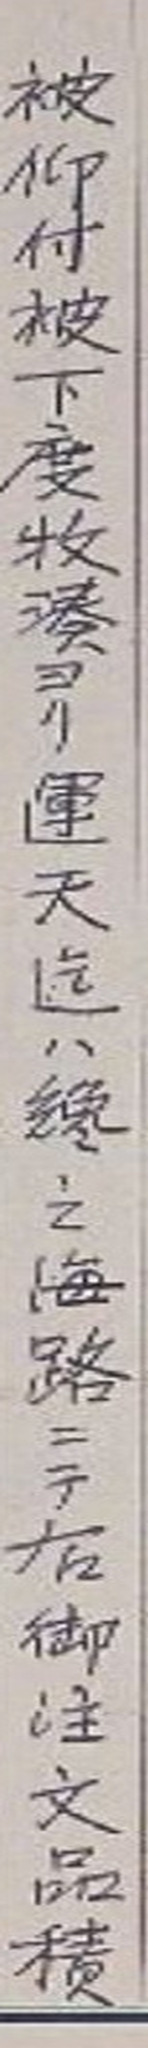被仰付被下度牧湊より運天迄は纔之海路にて右御注文品積
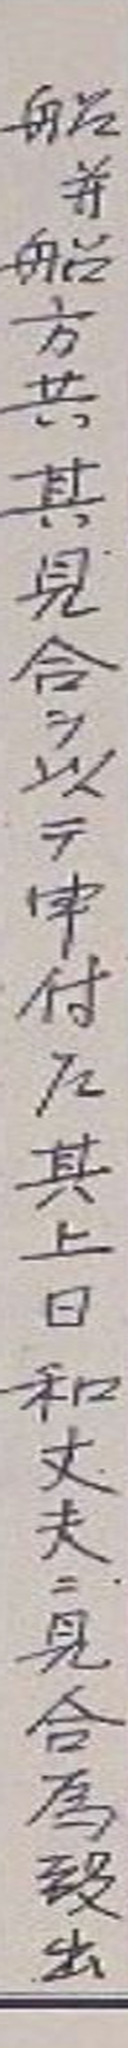船并船方共其見合を以て申付乍其上日和丈夫に見合為致出
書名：支那冊封使来琉諸記 下巻
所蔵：University of the Ryukyus Library
